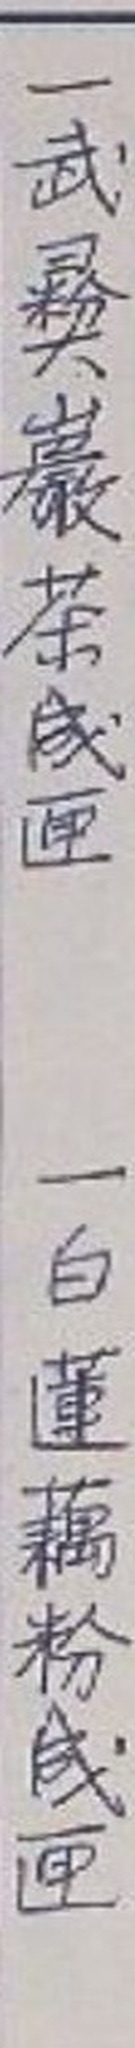一武彛巖茶成匣一白蓮藕粉成匣
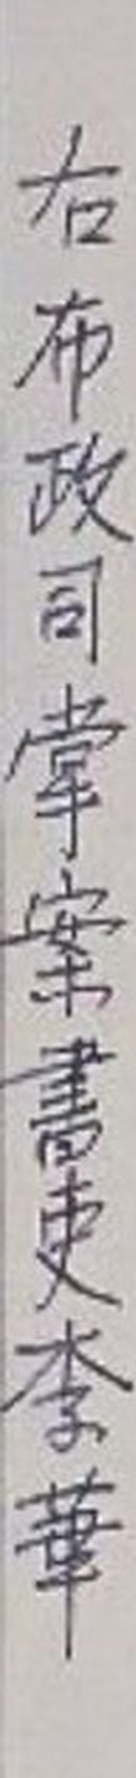右布政司掌案書吏李華
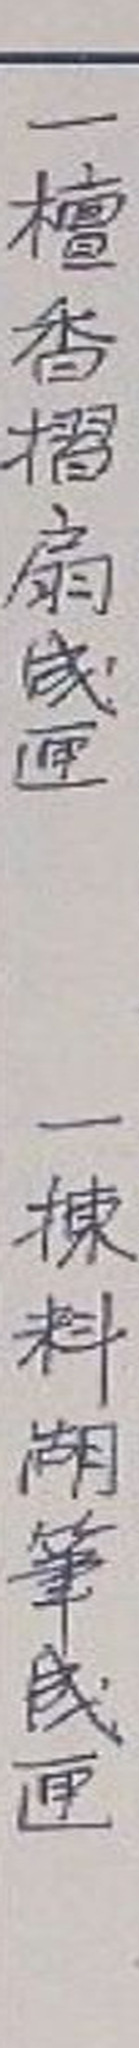一檀香摺扇成匣一揀料湖筆成匣
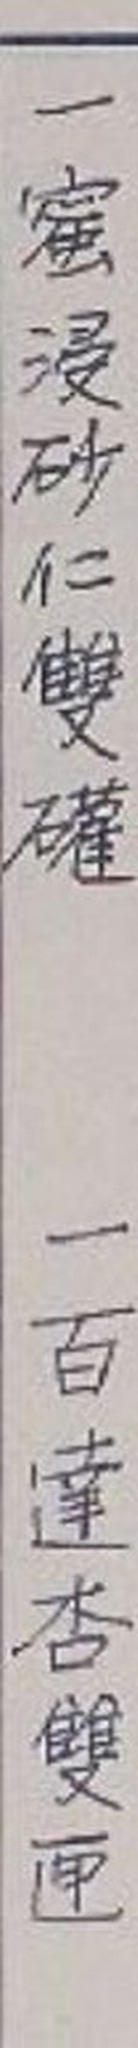一密浸砂仁雙礶一百達杏雙匣

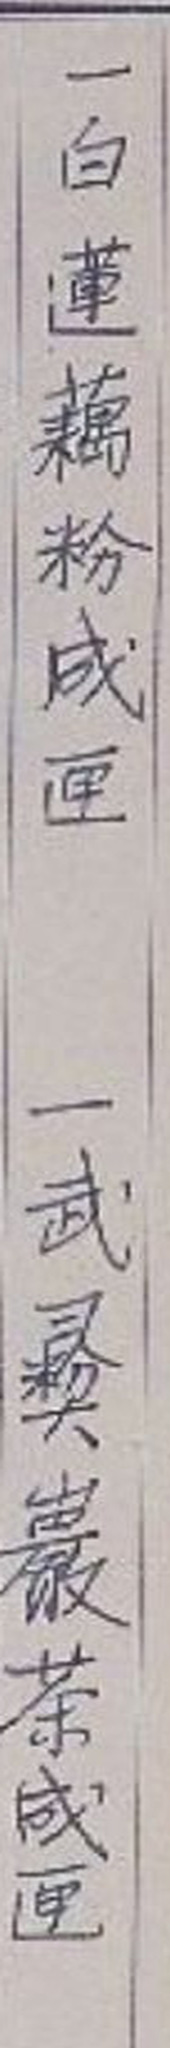一白蓮藕粉成匣一武彛巖茶成匣
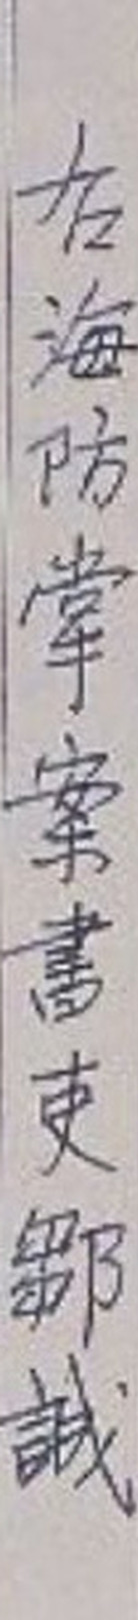右海防掌案書吏鄒誠
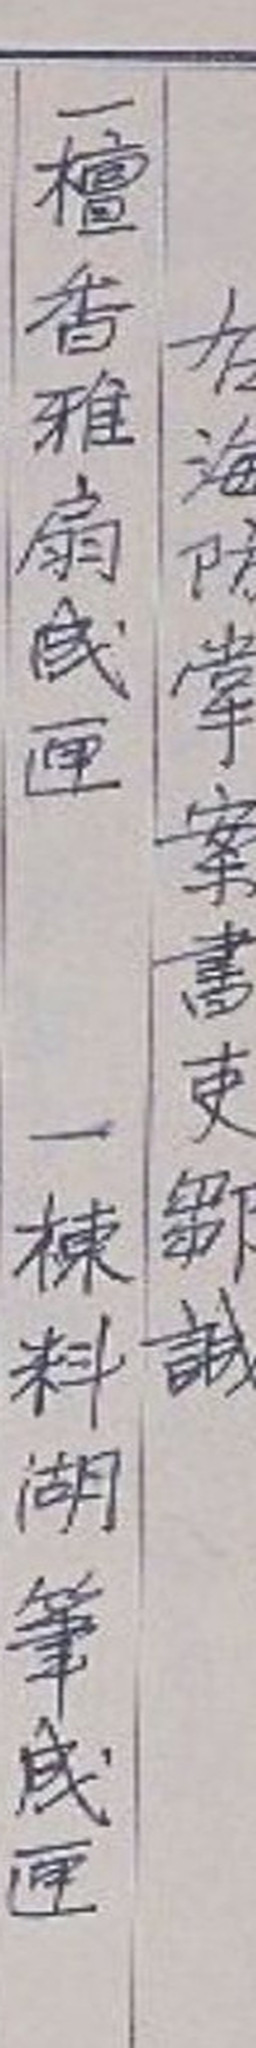一檀香雅扇成匣一揀料湖筆成匣
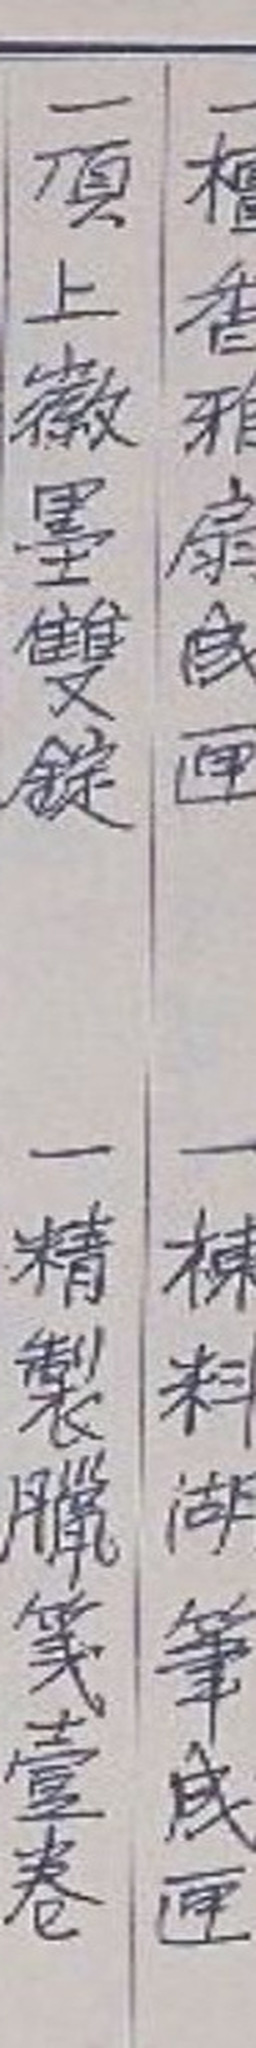一頂上𡽪墨雙錠一精製臘箋壱巻
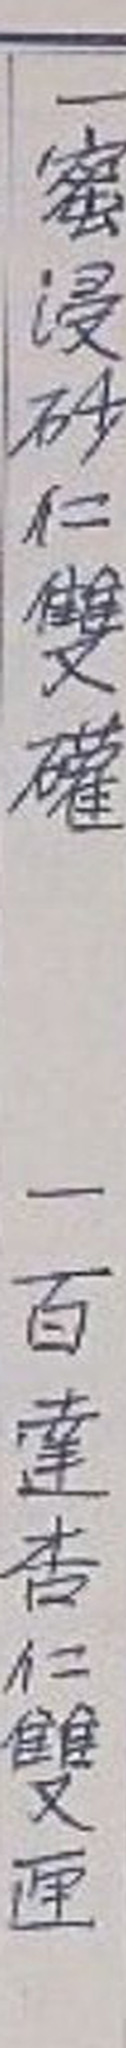一密浸砂仁雙礶一百達杏仁雙匣
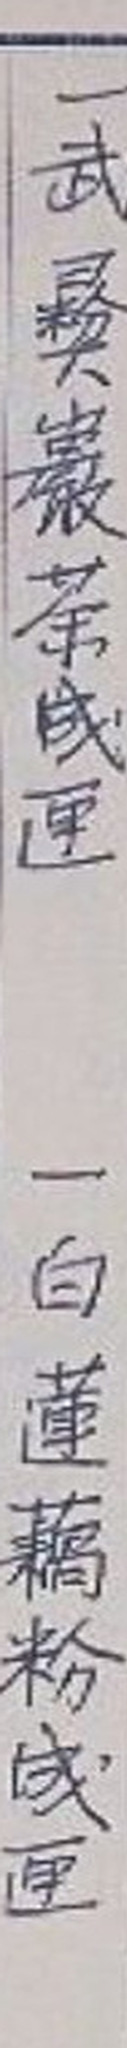一武彛巖茶成匣一白蓮藕粉成匣
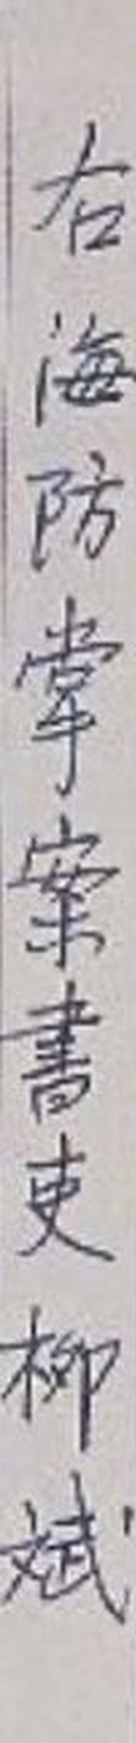右海防掌案書吏柳斌
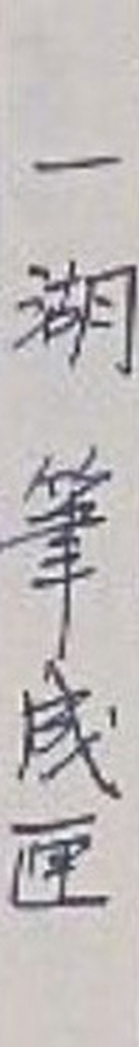一臘箋全巻一湖筆成匣
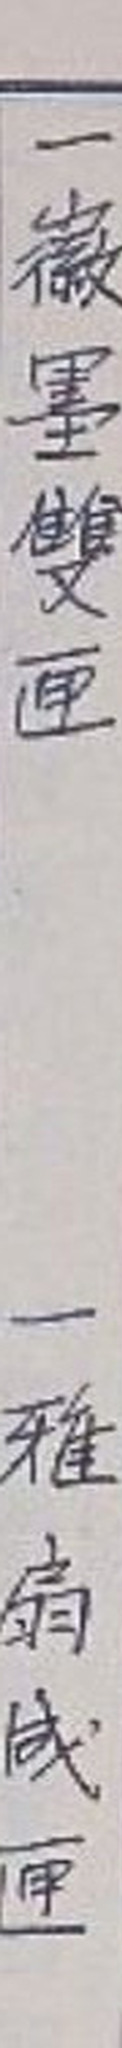一𡽪墨雙匣一雅扇成匣
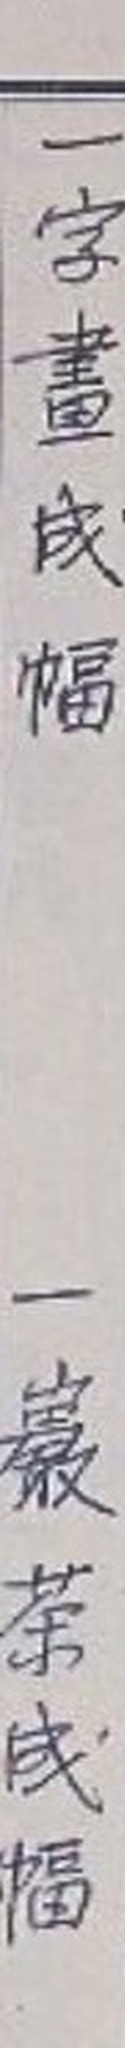一字画成幅一巖茶成匣
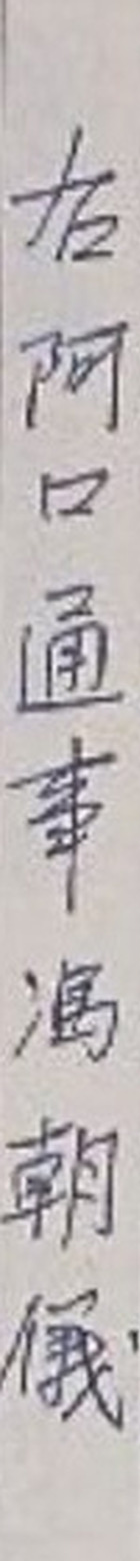右阿口通事馮朝儀
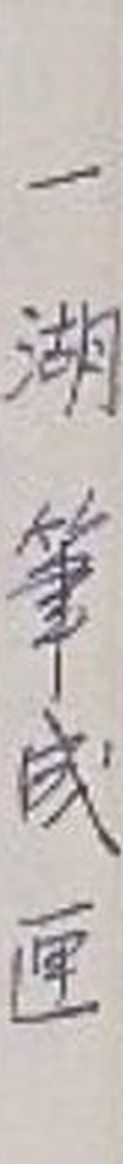一臘箋全巻一湖筆成匣
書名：支那冊封使来琉諸記 下巻
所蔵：University of the Ryukyus Library
